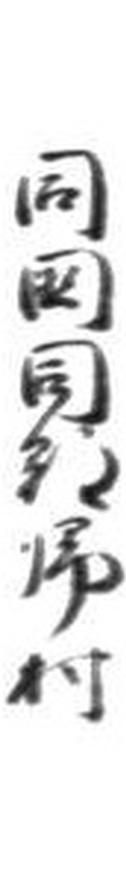同国同郡帰村
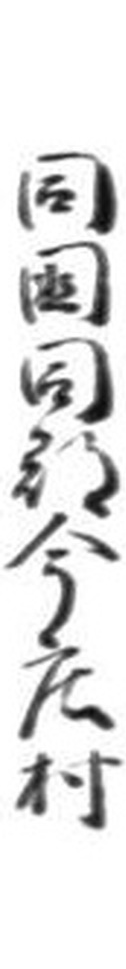同国同郡今庄村

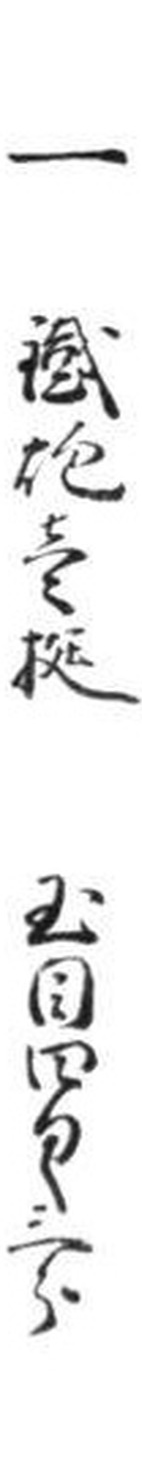一鉄炮壱挺玉目四匁又十郎
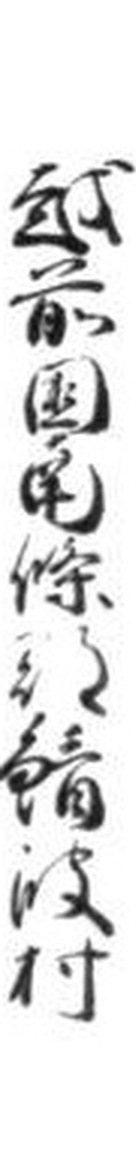越前国南條郡鯖波村
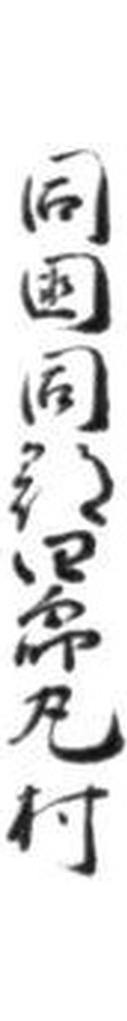同国同郡四郎丸村
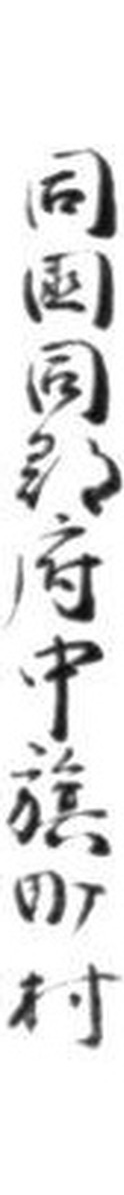同国同郡府中旗町村
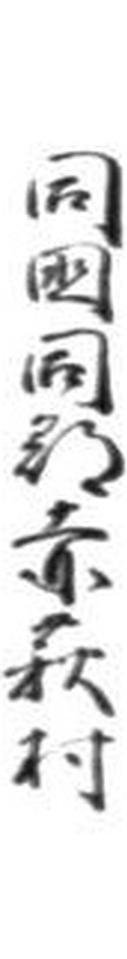同国同郡赤萩村
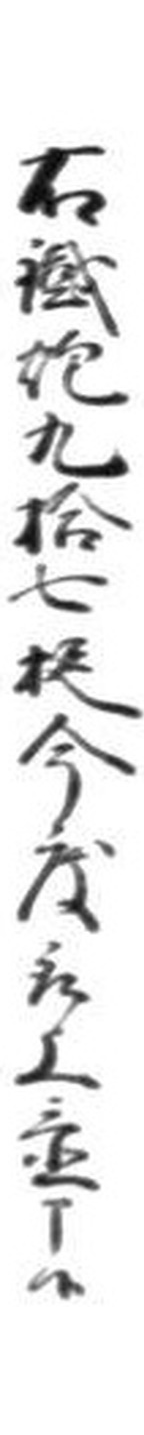右鉄炮九拾七挺今度取上置申候
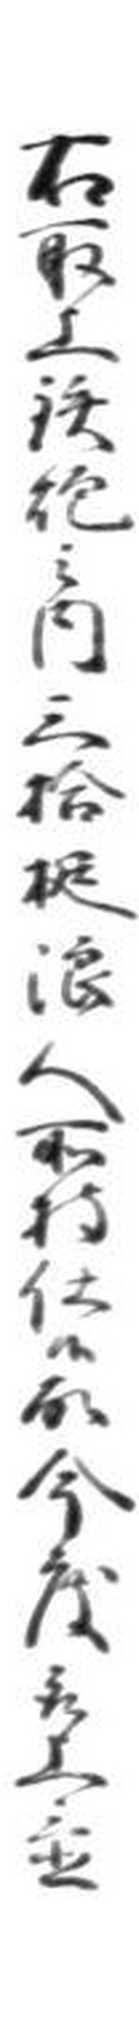右取上鉄炮之内三拾挺浪人所持仕候故今度取上置
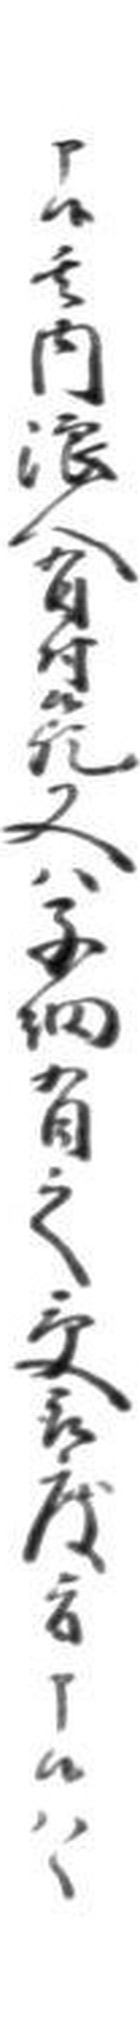申候其内浪人有付候歟又ハ子細有之受取度旨申候ハゝ
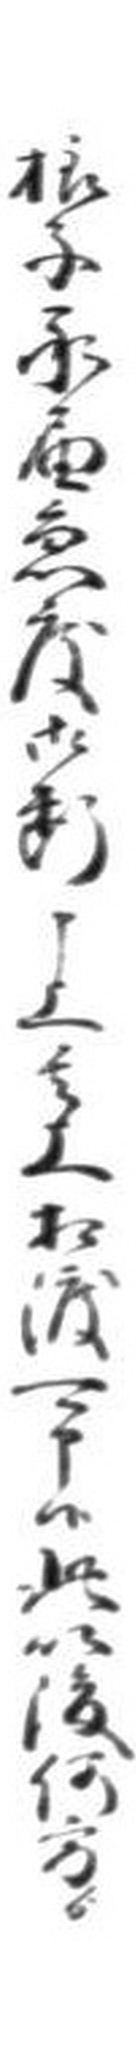様子承届急度御断申上其上相渡可申候此以後何方ゟ
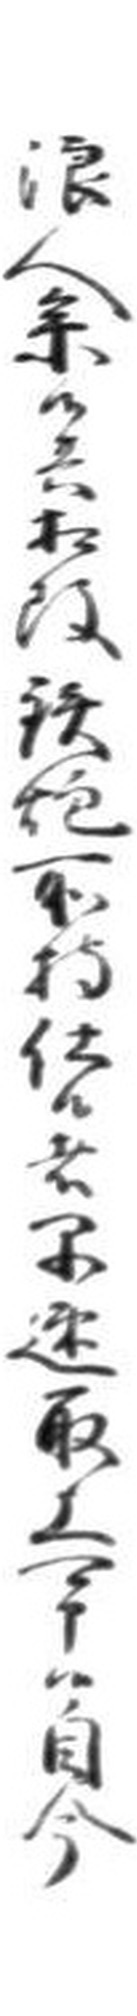浪人参候共相改鉄炮所持仕候者早速取上可申候自今
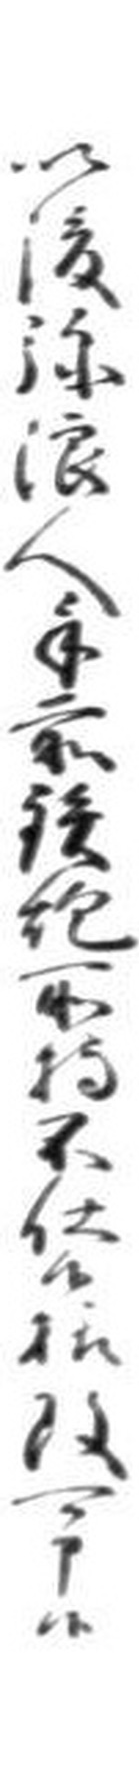以後弥浪人手前鉄炮所持不仕候様改可申候

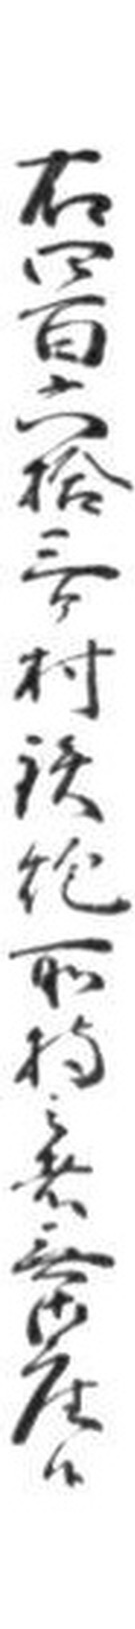右四百六拾三ヶ村鉄炮所持之者無御座候
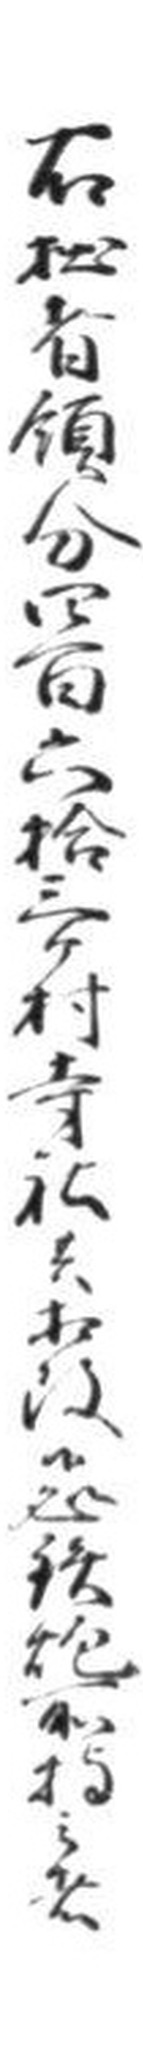右拙者領分四百六拾三ヶ村寺社共相改候処鉄炮所持之者
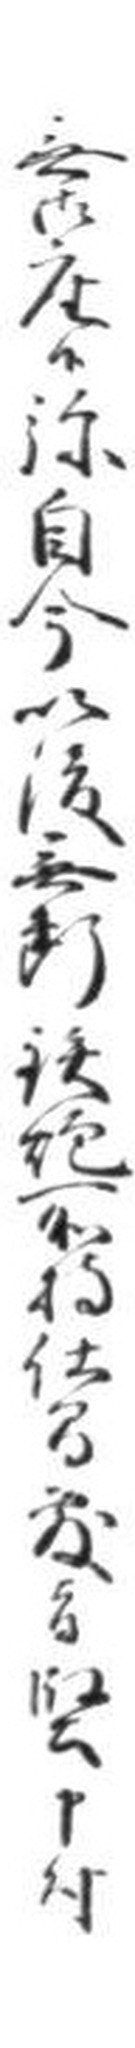無御座候弥自今以後無断鉄炮所持仕間敷旨堅申付
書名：家譜 十七 吉品公 従元禄元年到同二年
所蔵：福井県文書館 Fukui Prefectural Archives
